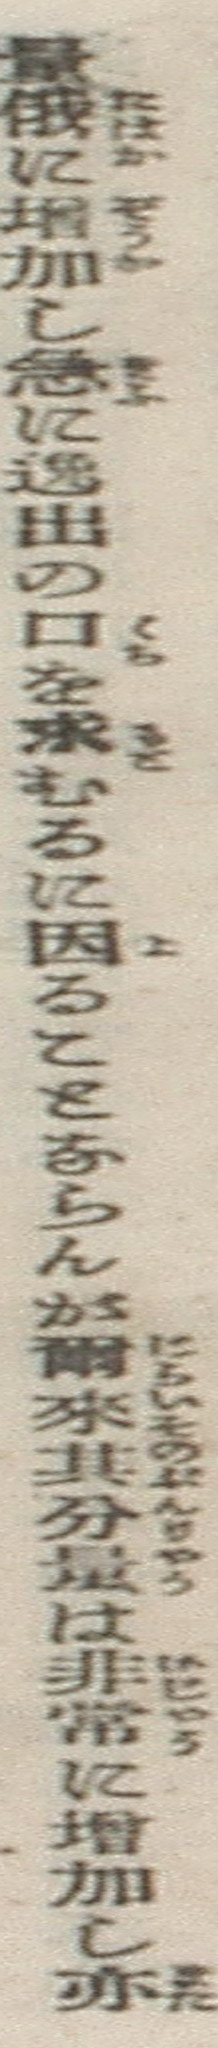量俄に増加し急に逸出の口を求むるに因ることならんが爾来其分量は非常に増加し亦
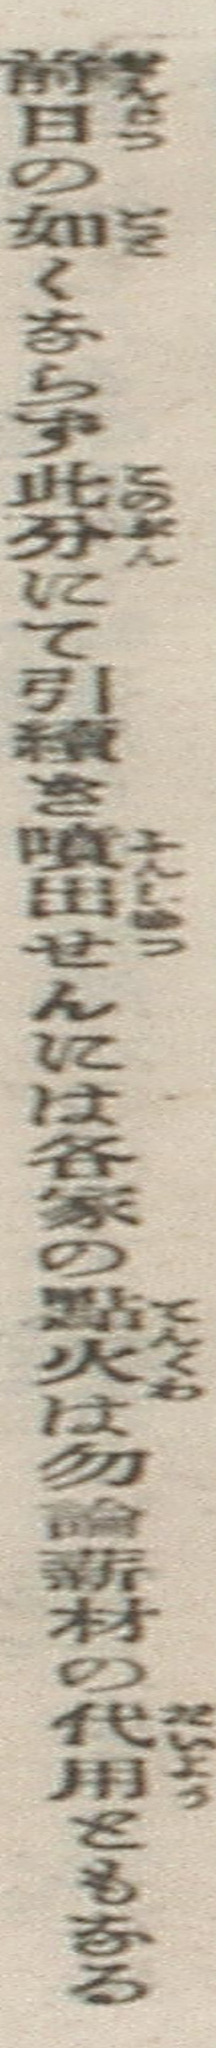前日の如くならず此分にて引續き噴出せんには各家の点火は勿論薪材の代用ともなる
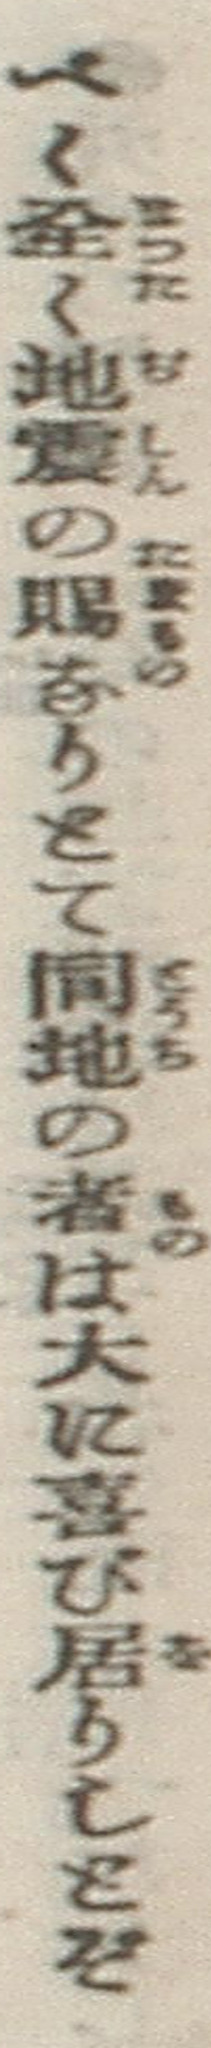べく全く地震の賜なりとて同地の者は大に喜び居りしとぞ

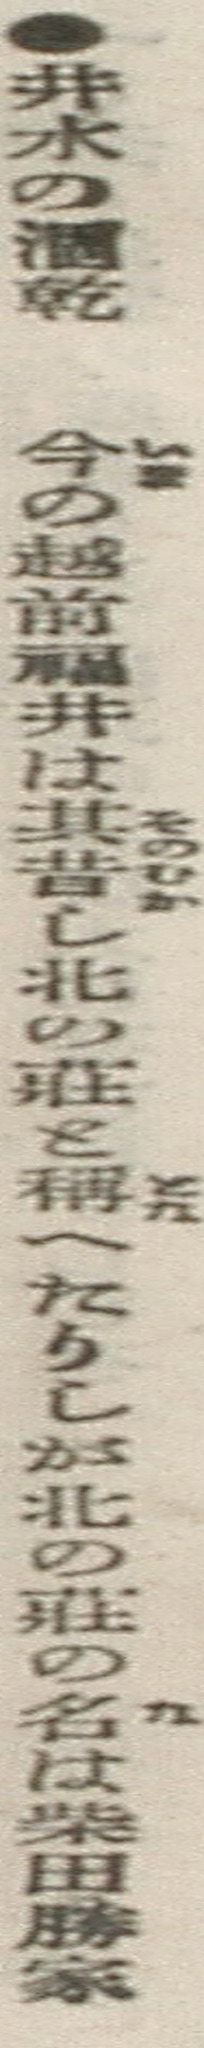●井水の涸乾今の越前福井は其昔し北の荘と稱へたりしが北の荘の名は柴田勝家
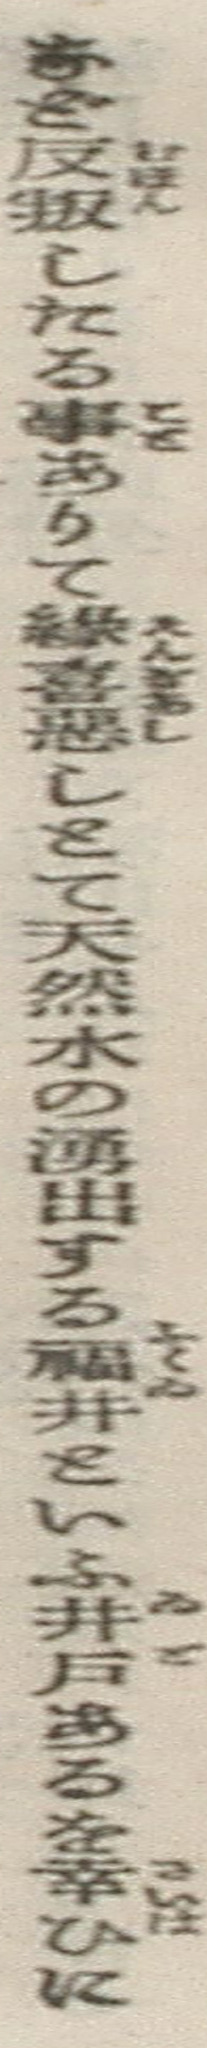など反叛したる事ありて縁喜悪しとて天然水の湧出する福井といふ井戸あるを幸ひに
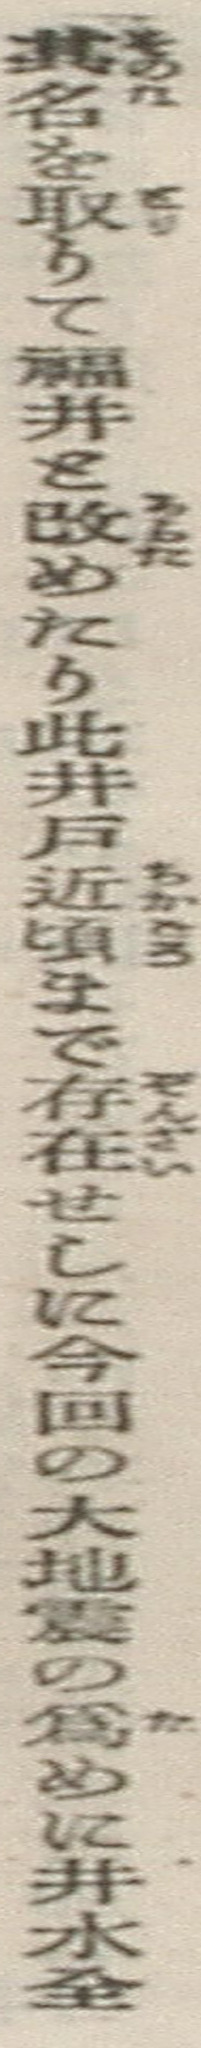其名を取りて福井と改めたり此井戸近頃まで存在せしに今回の大地震の為めに井水全
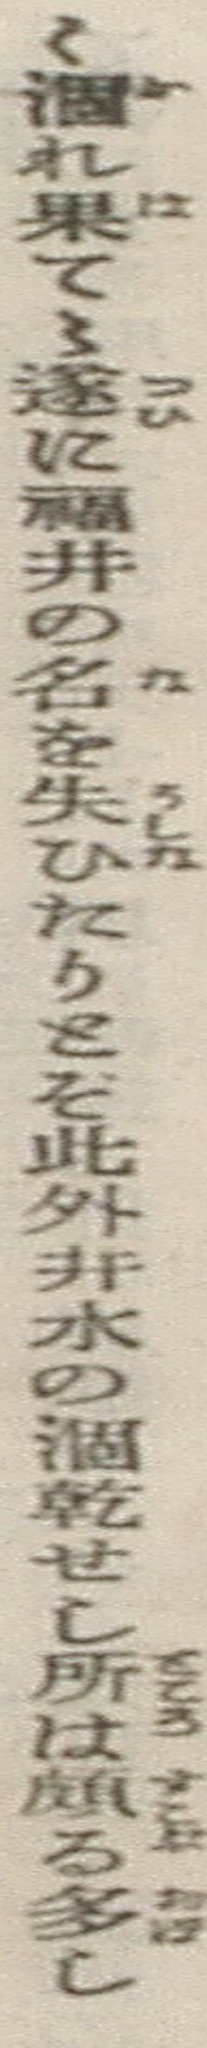く涸れ果て〻遂に福井の名を失ひたりとぞ此外井水の涸乾せし所頗る多し
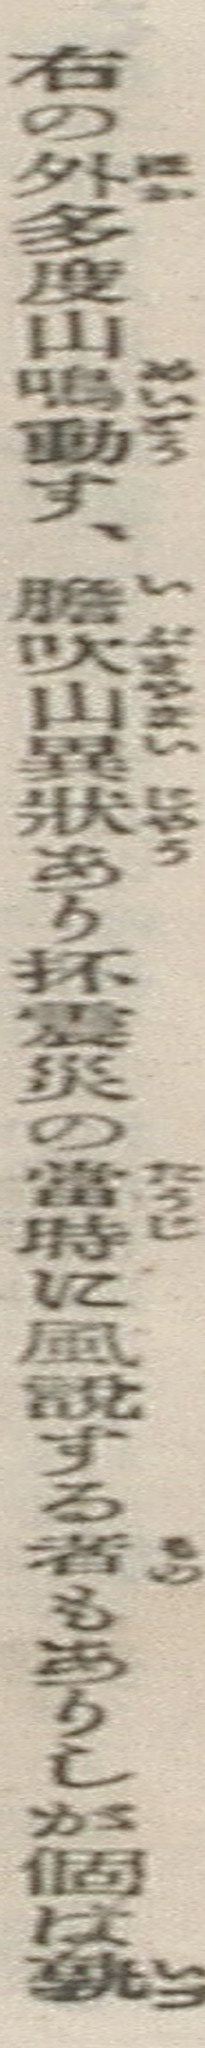右の外多度山鳴動す、膽吹山異状あり抔震災の当時に風説する者もありしが個は孰
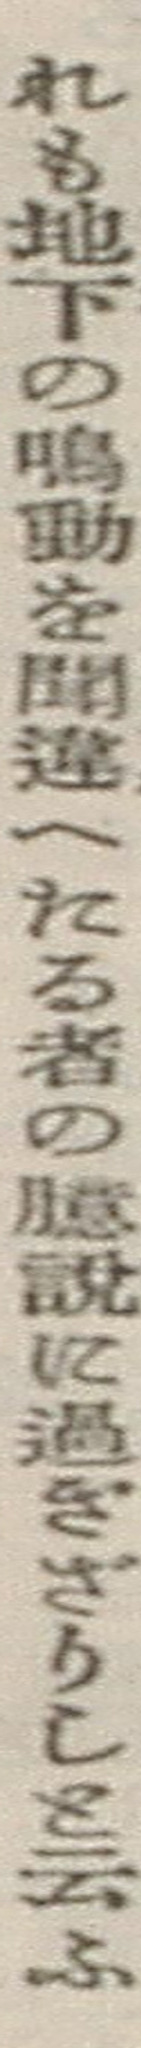れも地下の鳴動を聞違へたる者の憶説に過ぎざりしと云ふ
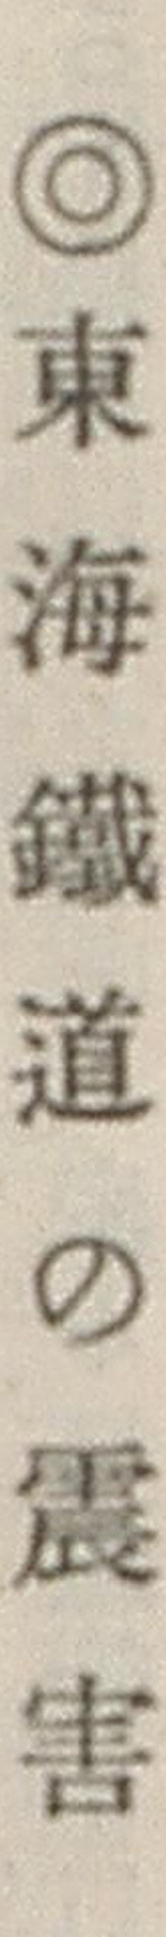◎東海鐡道の震害
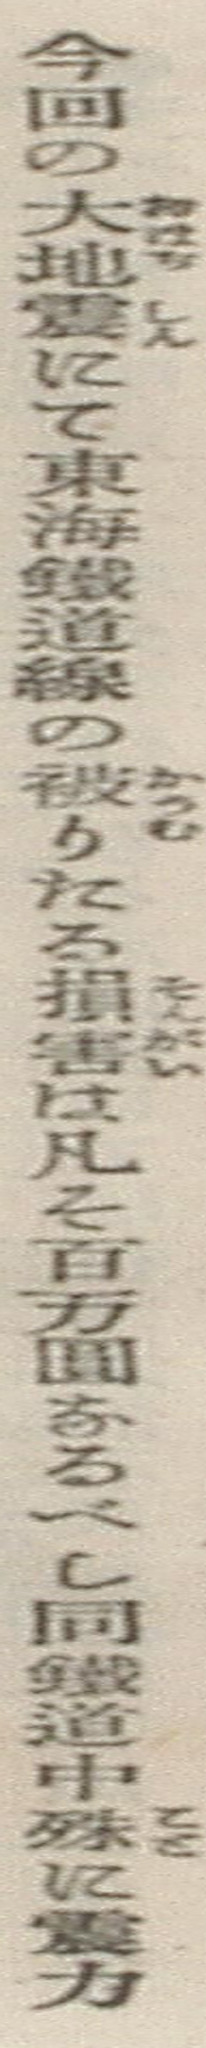今回の大地震にて東海鐡道線の被りたる損害は凡そ百万圓なるべし同鐡道中殊に震力
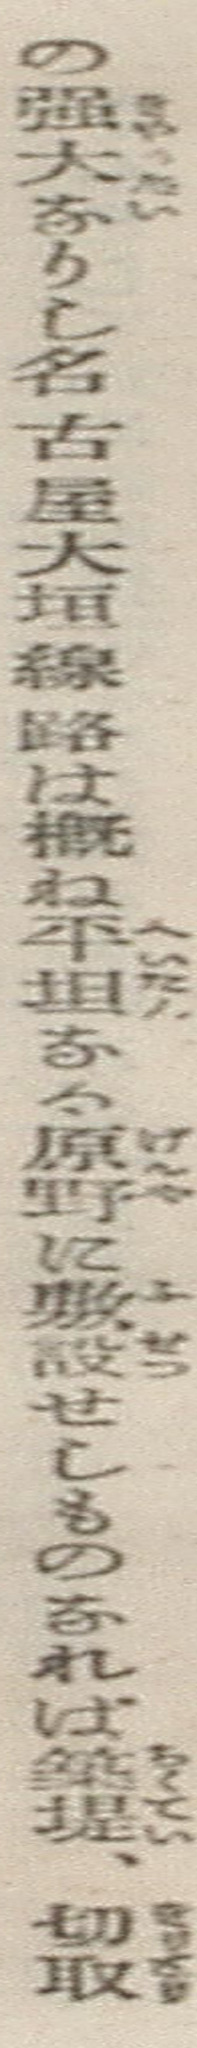の強大なりし名古屋大垣線路は概ね平坦なる原野に敷設せしものなれば築堤、切取
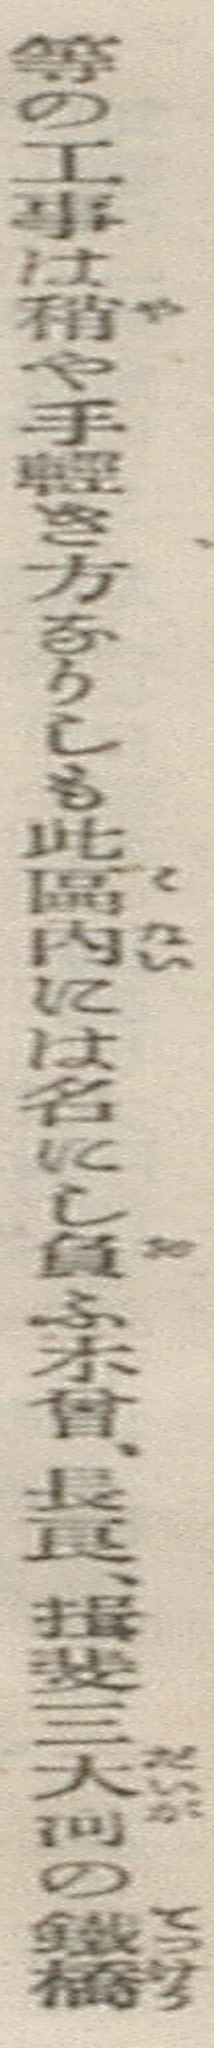等の工事は稍や手輕き方なりしも此區内には名にし負ふ木曽、長良、揖斐三大河の鐡橋
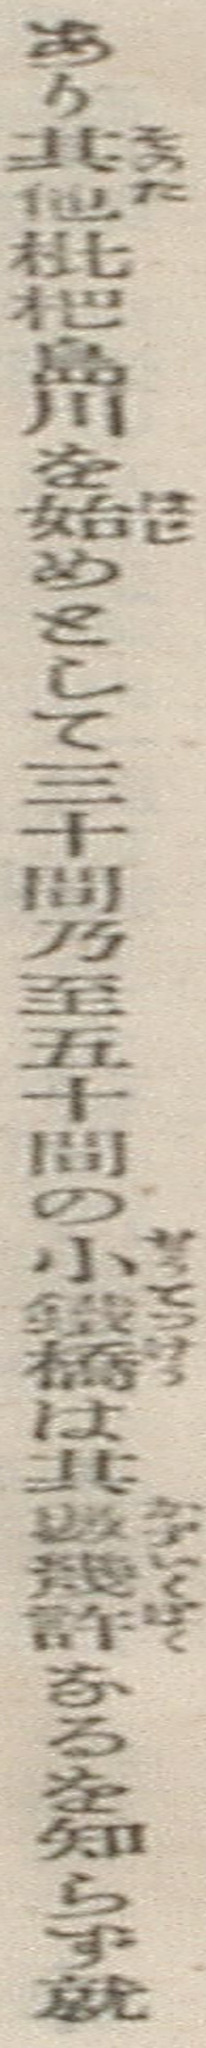あり其他枇杷島川を始めとして三十間乃至五十間の小鐡橋は其數幾許なるを知らず就
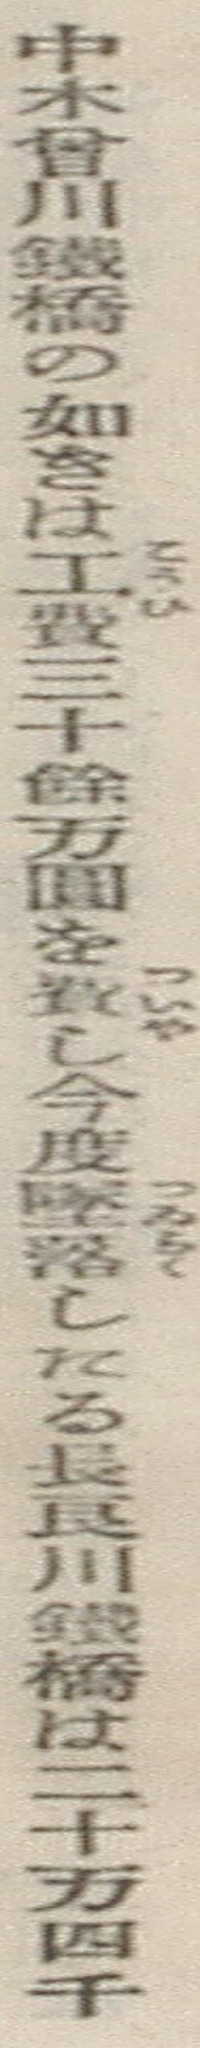中木曽川鐡橋の如きは工費三十餘万圓を費し今度墜落したる長良川橋は二十万四千
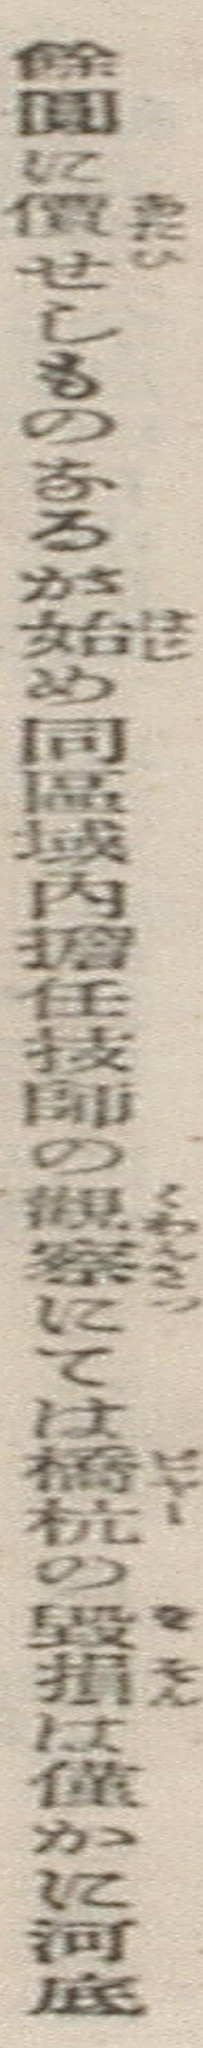餘圓に価せしものなるが始め同區域内擔任技師の観察にては橋杭の毀損は僅かに河底
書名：愛知岐阜福井三県　大地震見聞録（内題）
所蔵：東京大学地震研究所図書室 Earthquake Research Institute Library, The University of Tokyo, JAPAN
